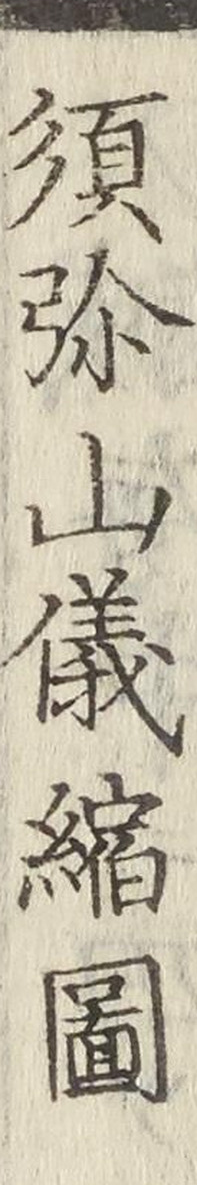須弥山儀縮図
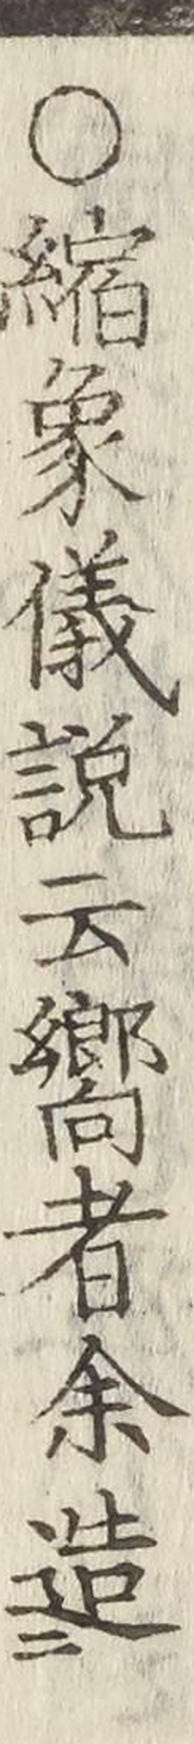〇縮象儀説云嚮者余造ニ
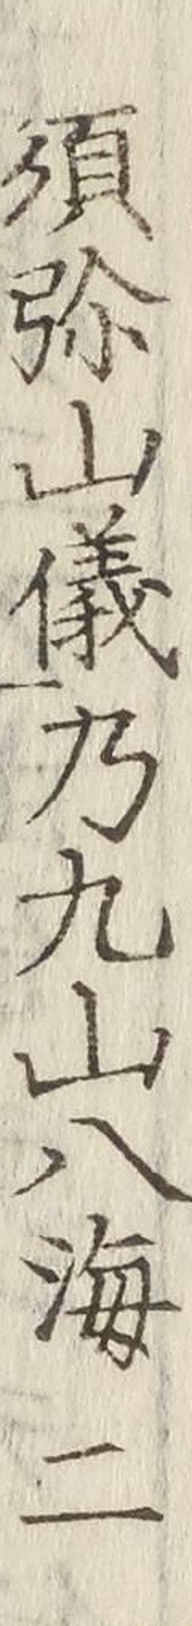須弥山儀乃九山八海ニ
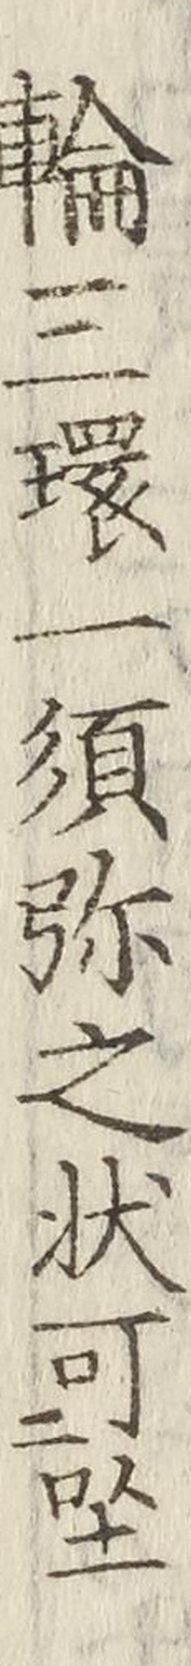輪三環一須弥之状可ニ坐
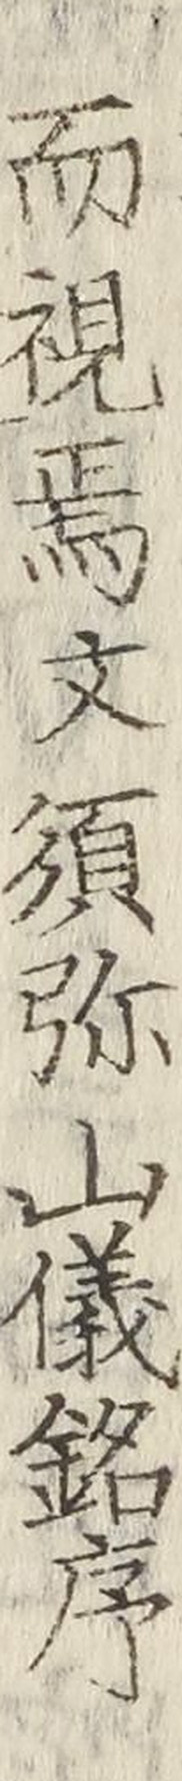而視焉文須弥山儀銘序
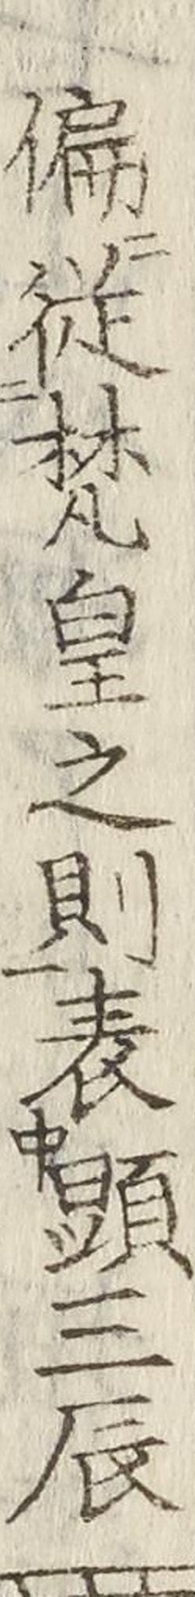偏従ニ梵皇之則表顕三辰
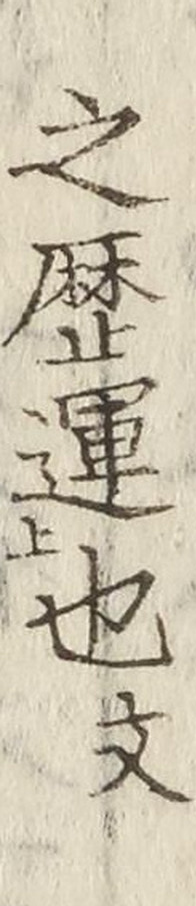之歴運也文

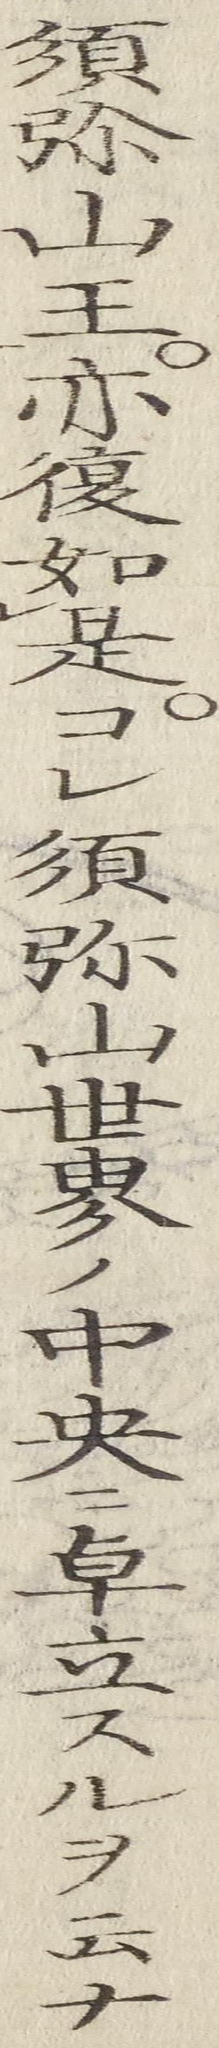須弥山王。亦復如是。コレ須弥山世界ノ中央ニ卓立スルヲ云ナ
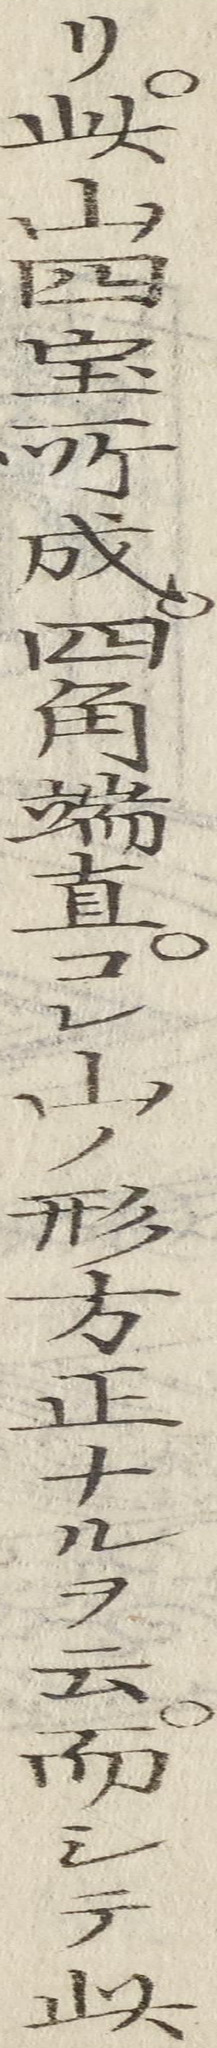リ。此山四宝所成。四角端直。コレ山ノ形方正ナルヲ云。而シテ此
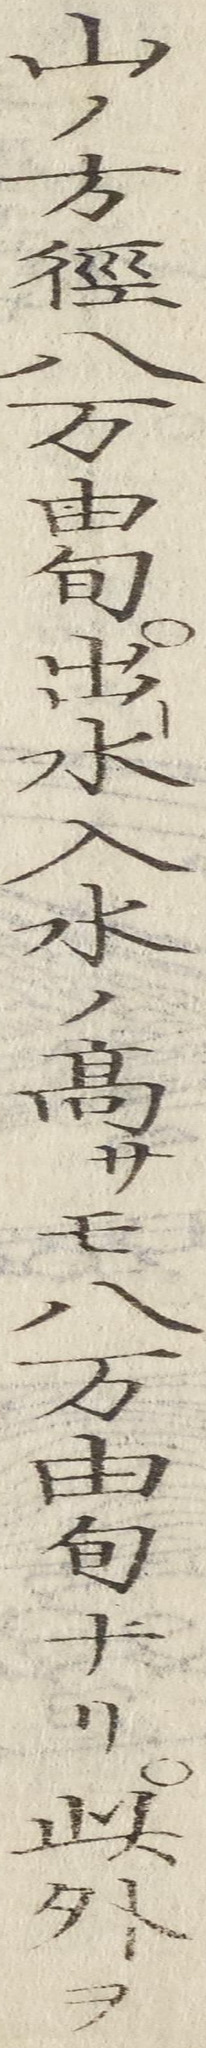山ノ方径八万由旬。出水入水ノ高サモ八万由旬ナリ。此外ヲ
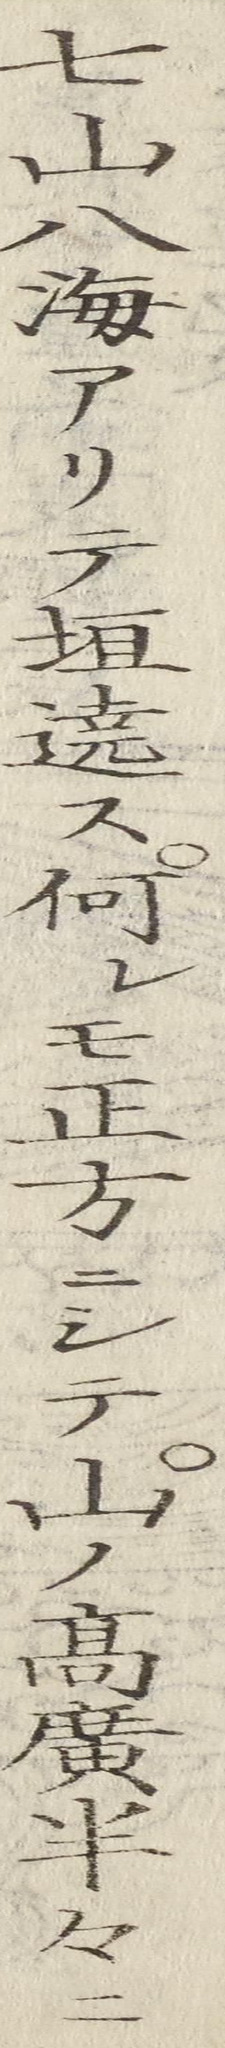七山八海アリテ垣遶ス。何レモ正方ニシテ。山ノ高広半々ニ
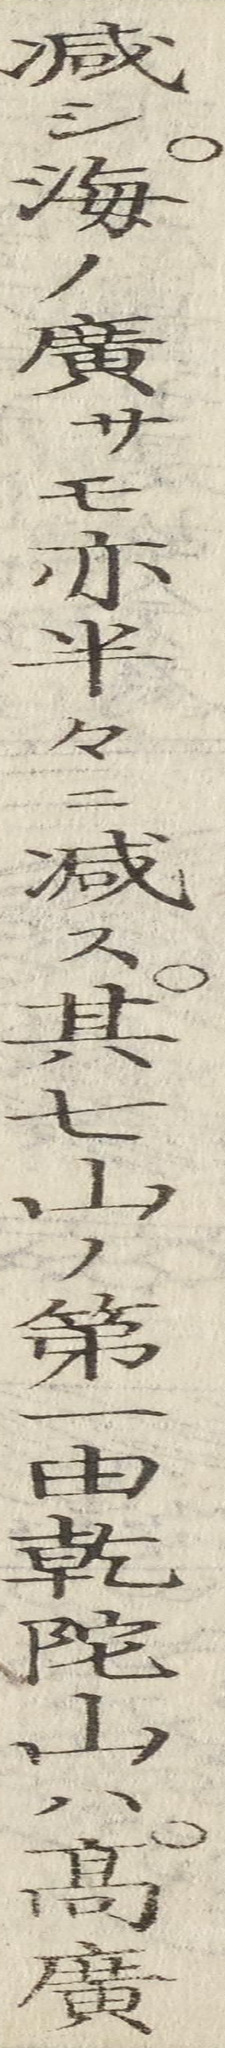減シ。海ノ広サモ亦半々ニ減ス。其七山ノ第一由乾陀山ハ。高広
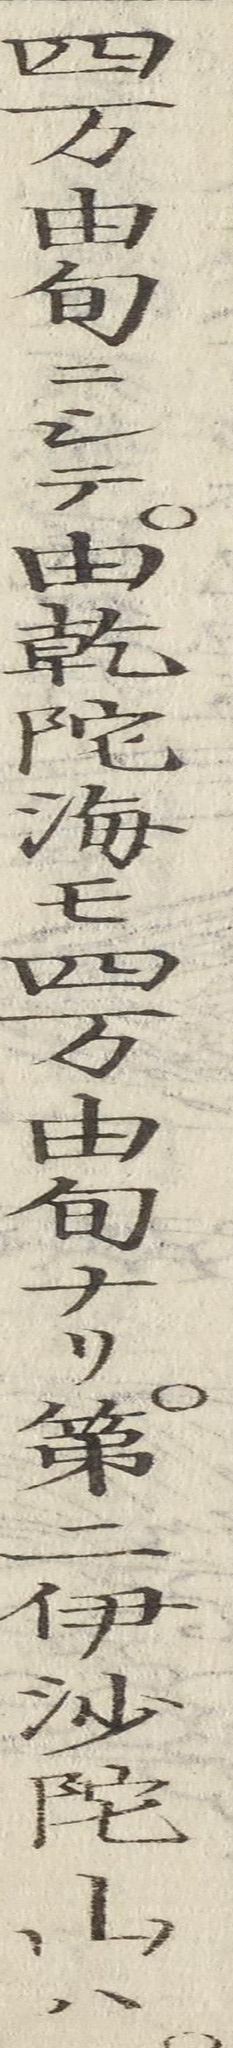四万由旬ニシテ。由乾陀海モ四万由旬ナリ。第ニ伊沙陀山ハ。
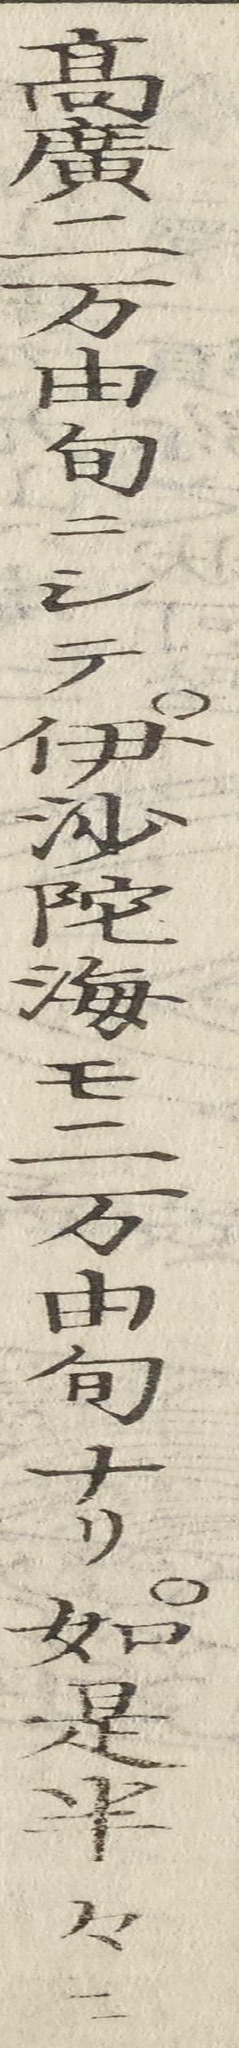高広二万由旬ニシテ。伊沙陀海モ二万由旬ナリ。如是半々ニ
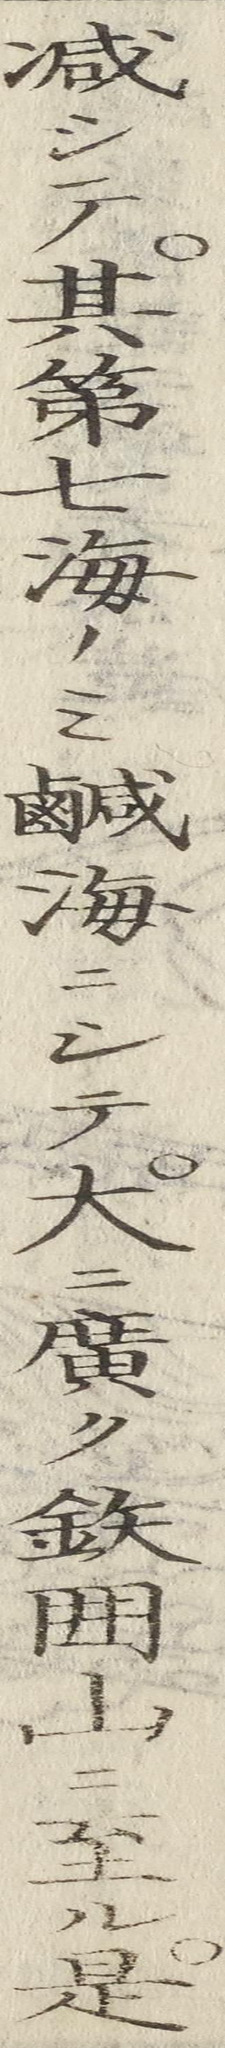減シテ。其第七海ノミ鹹海ニシテ。大ニ広ク鉄囲山ニ至ル。是
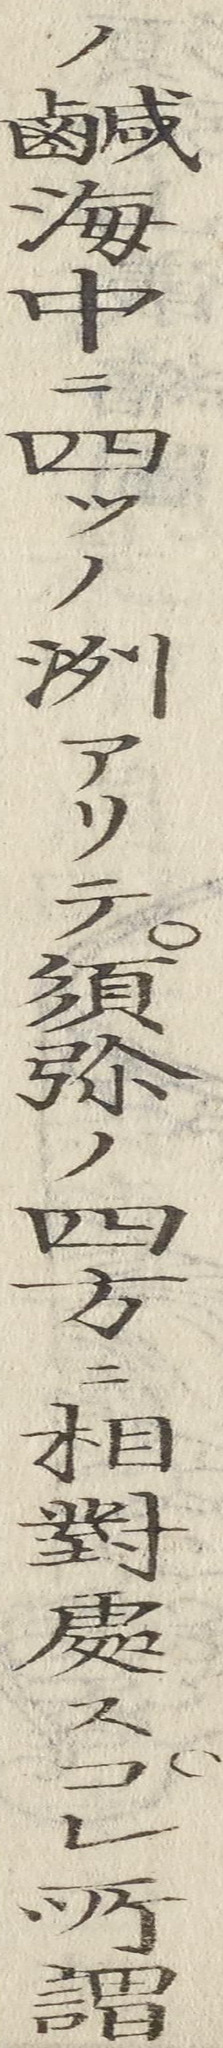ノ鹹海中ニ四ツノ洲アリテ。須弥ノ四方ニ相対処ス。コレ所謂
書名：護法新論　二編　上
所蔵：東京大学地震研究所図書室 Earthquake Research Institute Library, The University of Tokyo, JAPAN
